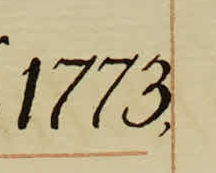1773,
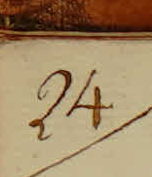24
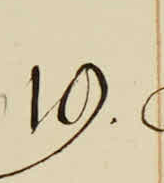19.
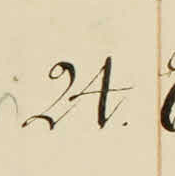24.
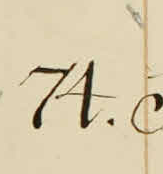74.
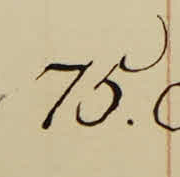75.
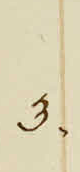3
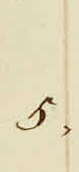5
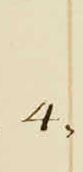4
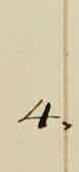4
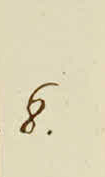8.
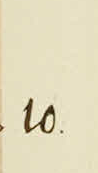10.
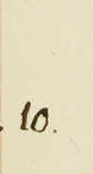10.
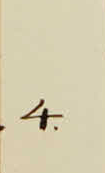4.
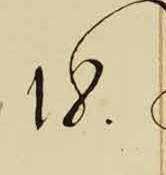18.
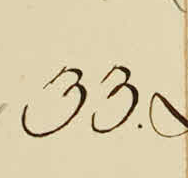33.
